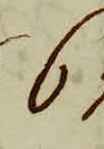6
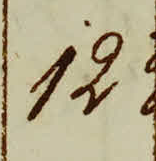12
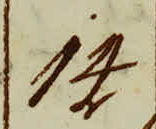14
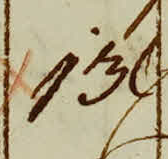13
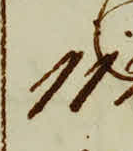11
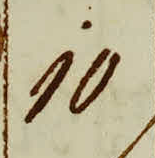10
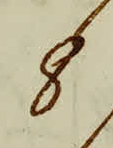8
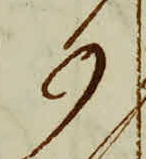9
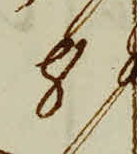8
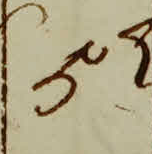5
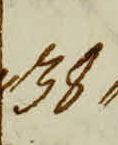38
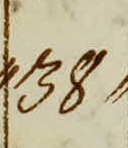38
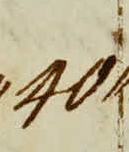40
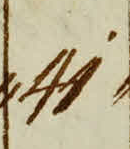41
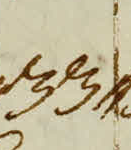33
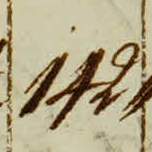142
